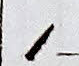1
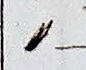1
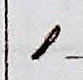1
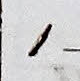1
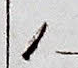1
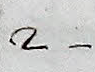2
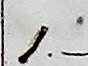1.
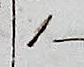1
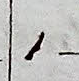1
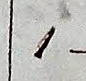1
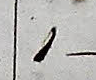1
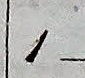1
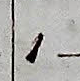1
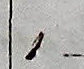1
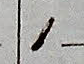1
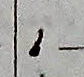1
